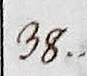38
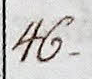46
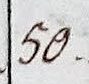50
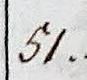51
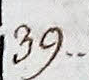39
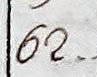62
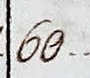60
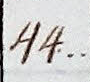44
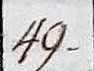49
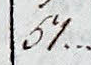51.
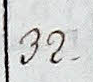32
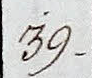39
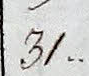31
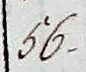56
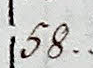58
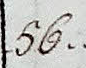56
